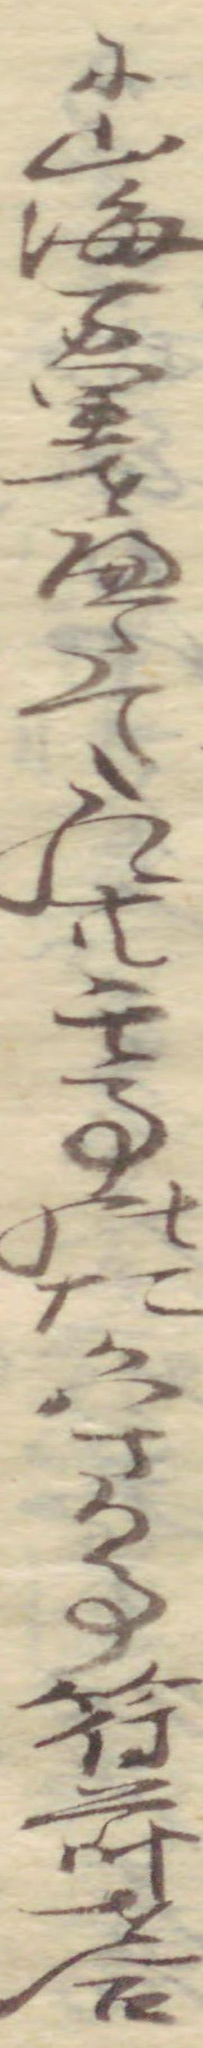に山海万里をへたてたれ共其事のたかはさる事符節を合
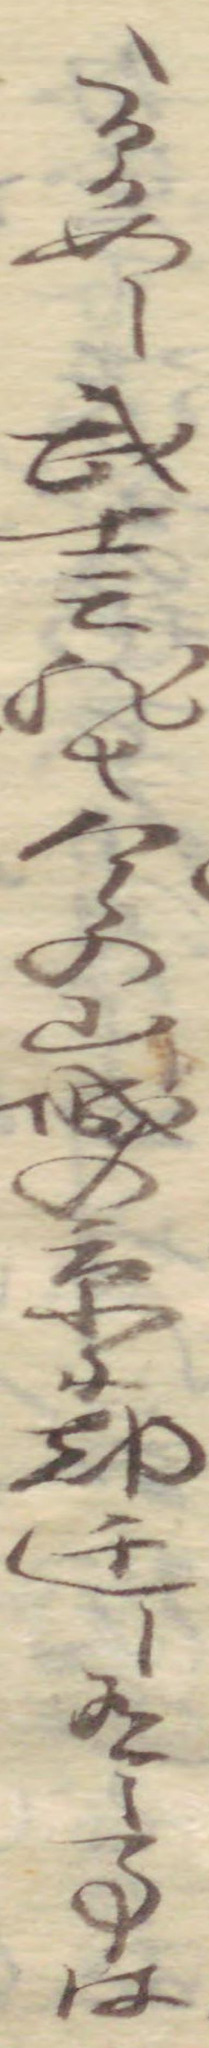たるか如し武士云然は今の山城の京に都遷し有し事は
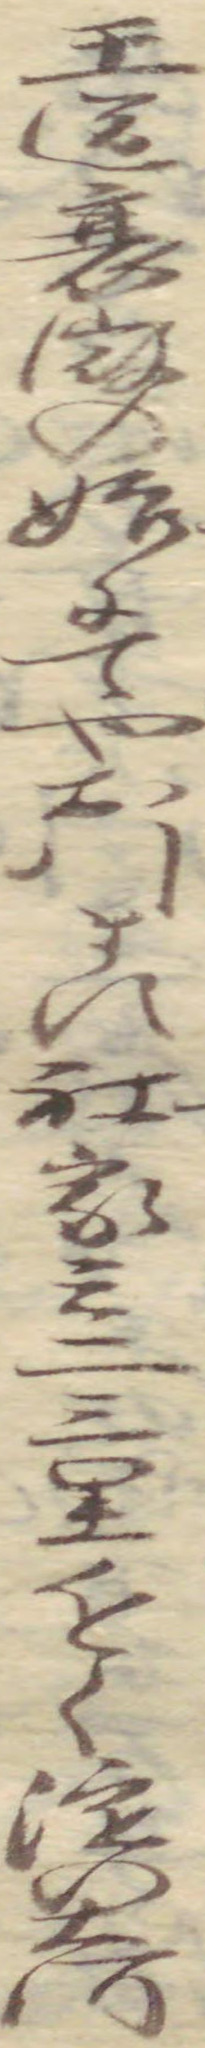王道衰微の始にてやおはします社家云二三里近く淀の大河
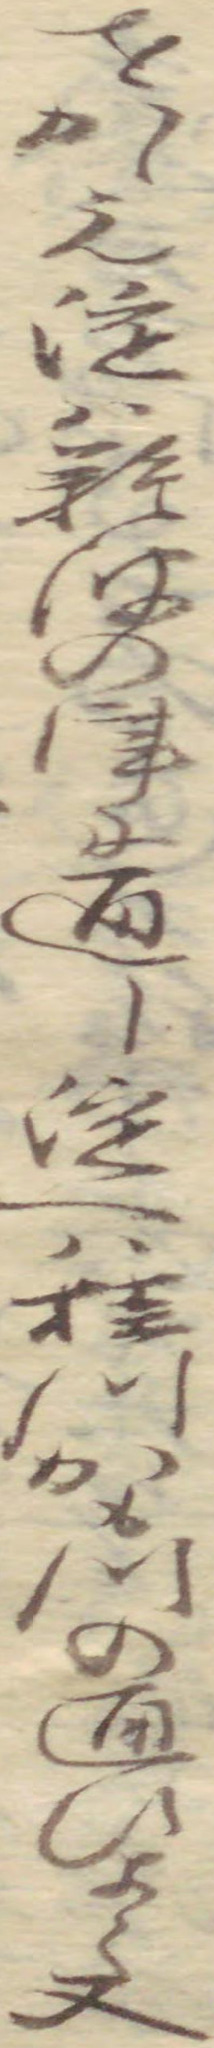をかゝえ淀は難波の津に通し淀へは桂川かも川の通ひよく又
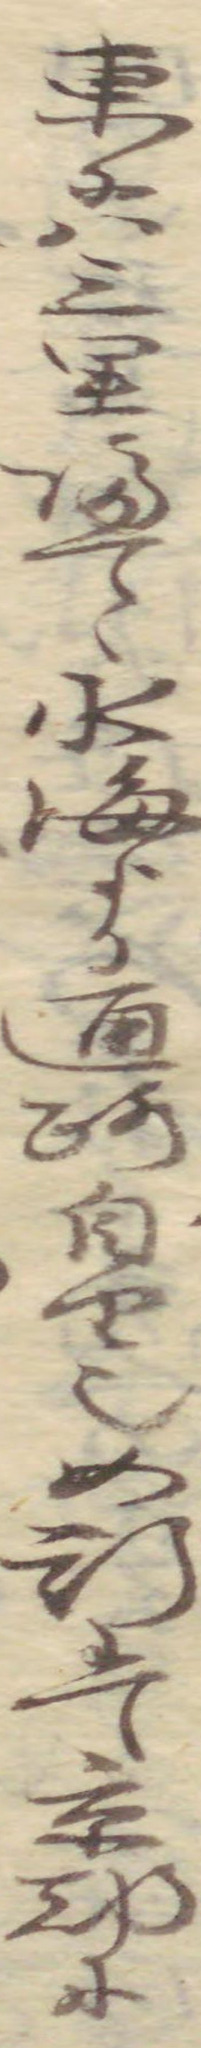東には三里隔てゝ水海より通路自由也如斯にて京都に
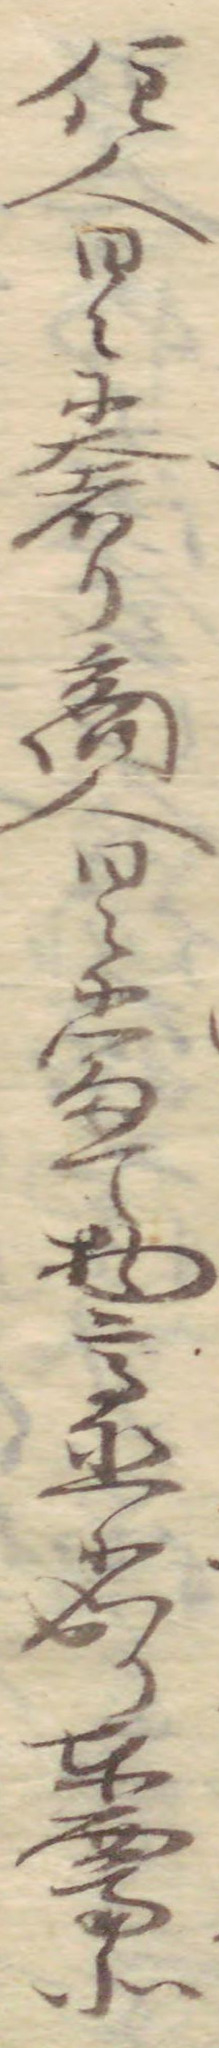住人日〻に驕り商人日〻に富て物高直に成り東西南北
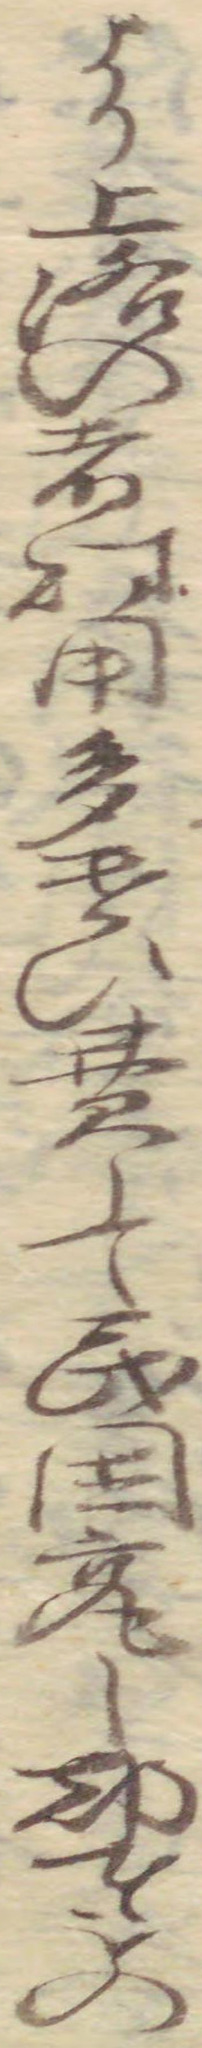より上洛の物財用多遣ひ費して民国窮し都をもの
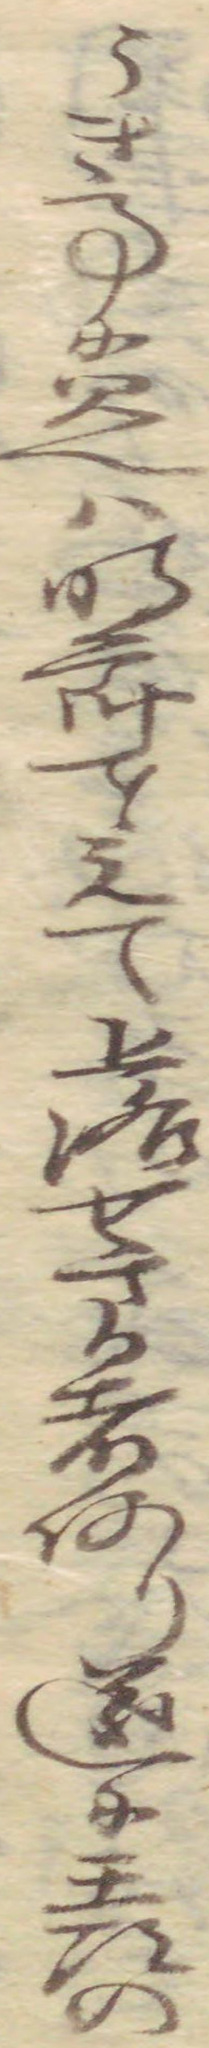うき事に思へは時節をえて上洛せさる者あり遂に王道の
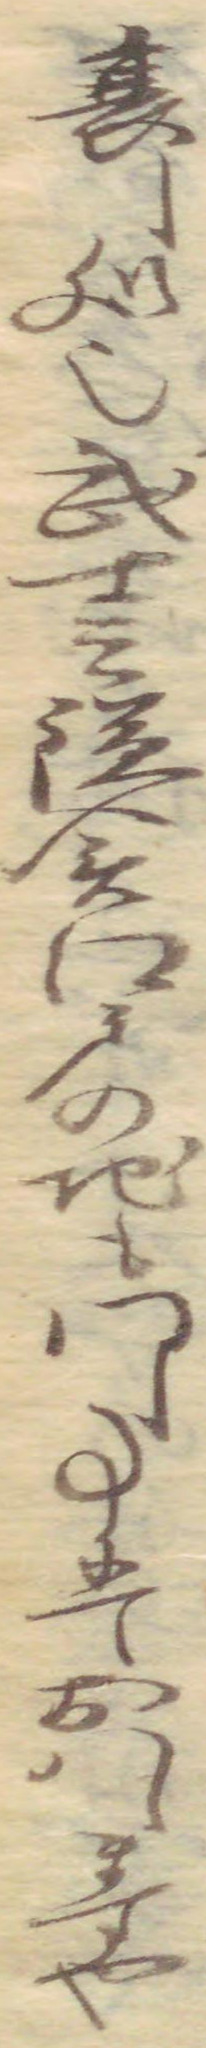衰し処也武士云鎌倉江戸の地も同し事にておはしますや

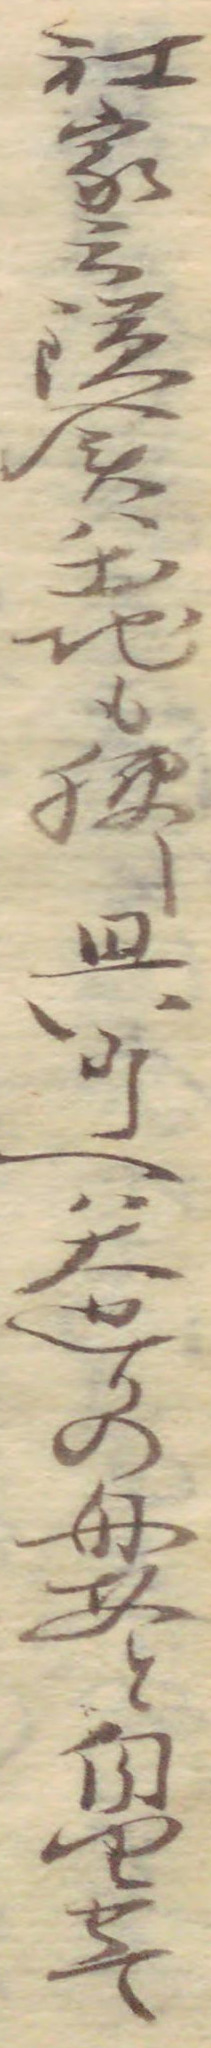社家云鎌倉は土地も狭し且いにしへは大廻りの舟なと自由せて
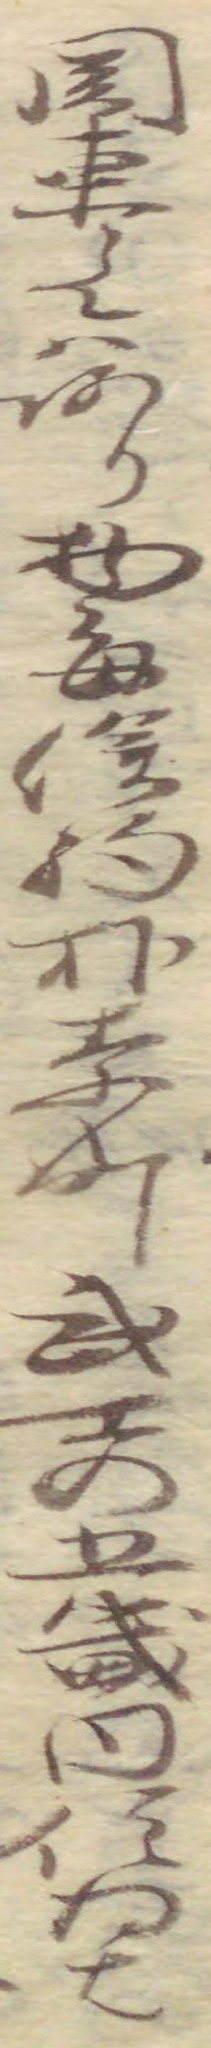関東ニてはあり物毎倹約朴素成し武士の五畿内住ゐは
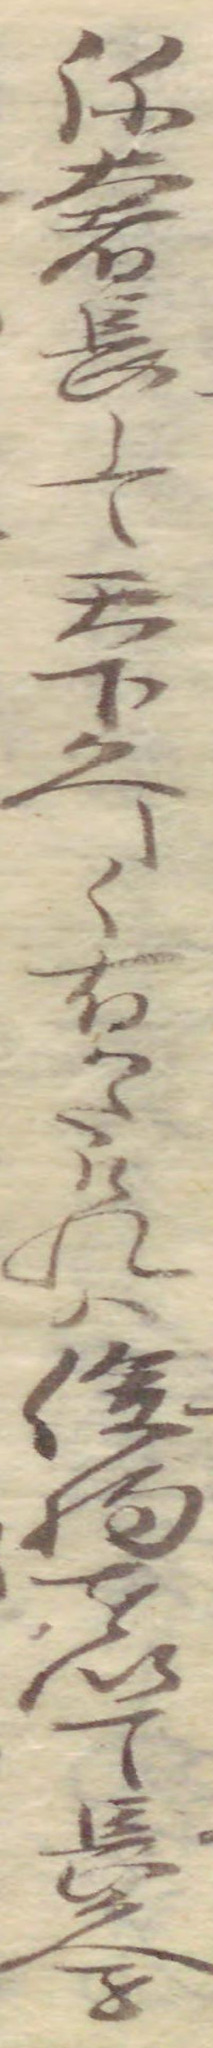弥奢長して天下久しく有かたけれは倹約を以て長久を
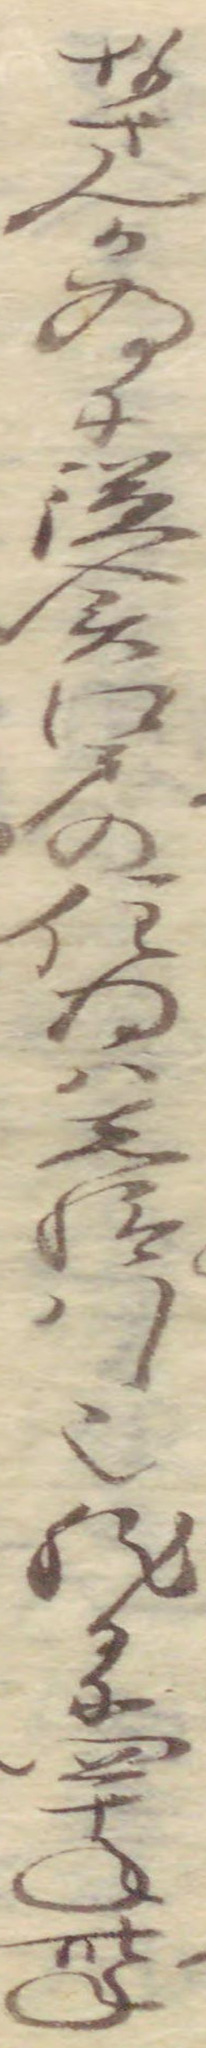なさんか為に鎌倉江戸の住ゐはし給はし也然るに四十年卅年
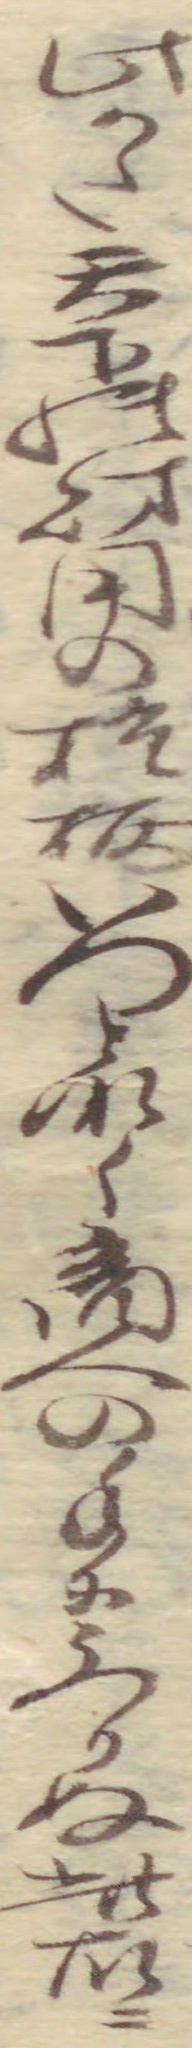此かた天下の財用の権柄いつとなく商人の手にうつりぬ此故ニ
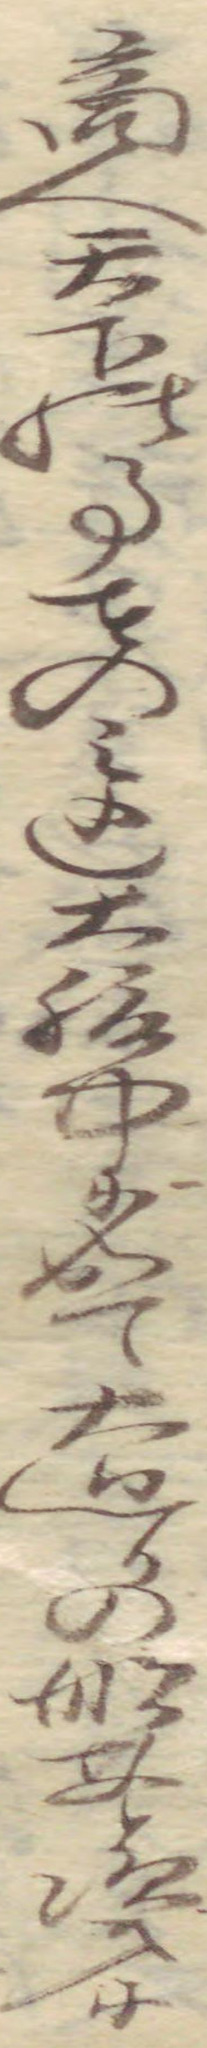商人天下の事をのみ込大腹中に成て大廻りの船なと次第に
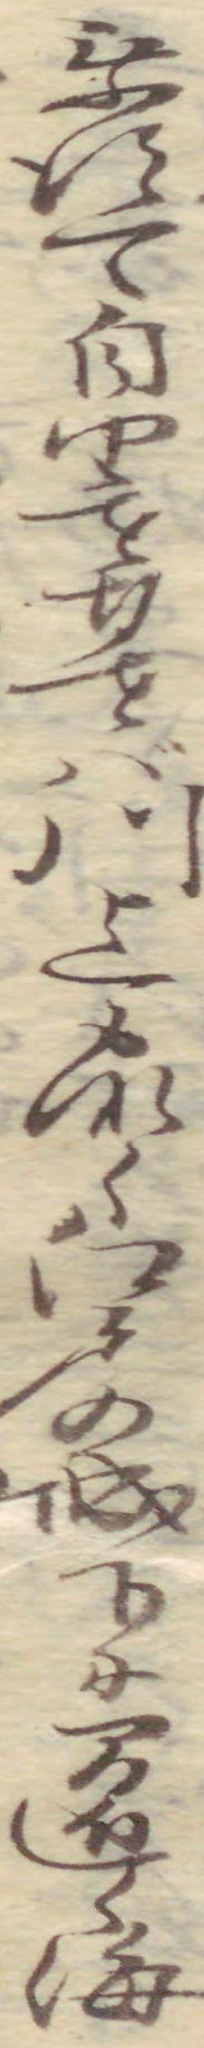乗得て自由をなせば川迄もなく江戸の城下に間近く海
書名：鶯宿雑記. 巻263-264
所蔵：国立国会図書館 National Diet Library, JAPAN
